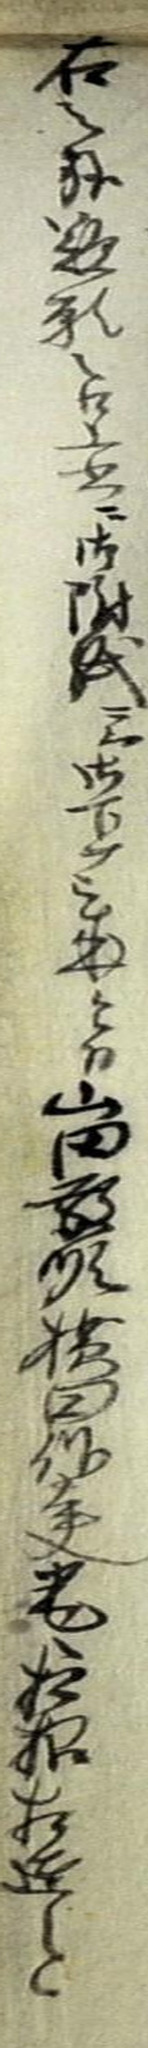右之趣歎願之口上書ニ附紙ニ而御下ケ被成ニ付山田敬順横田作太夫宅へ相招相達之候

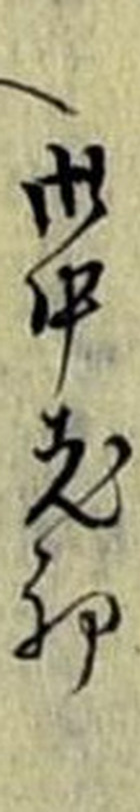御中老初
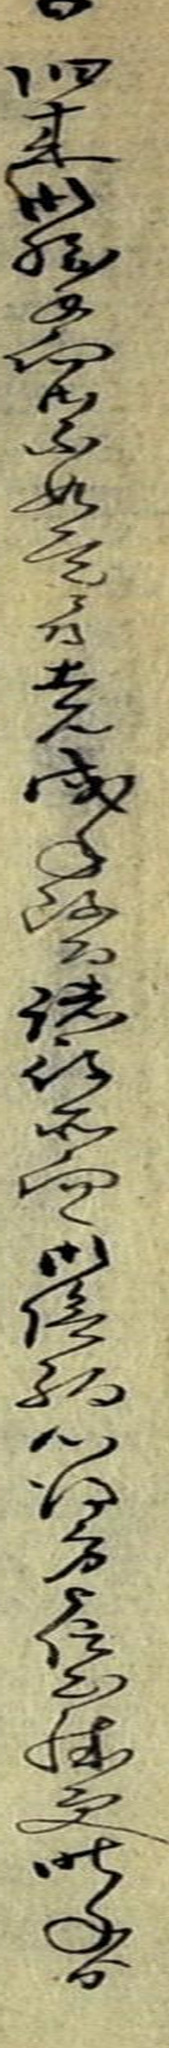〇旧来御勝手向御不如意ニ付去ル戌年改而諸役所向へ御倹約心得方被仰出殊更昨年ゟ
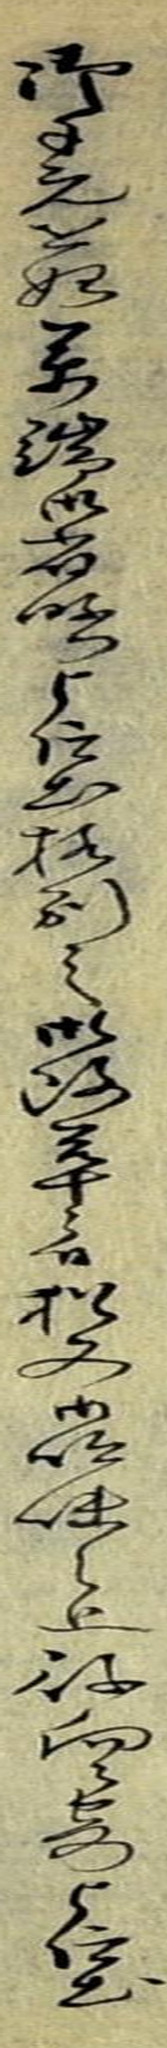御手元を始万端御省略被仰出格別之御改革ニ付猶又御吟味之上役向ニ寄被仰出
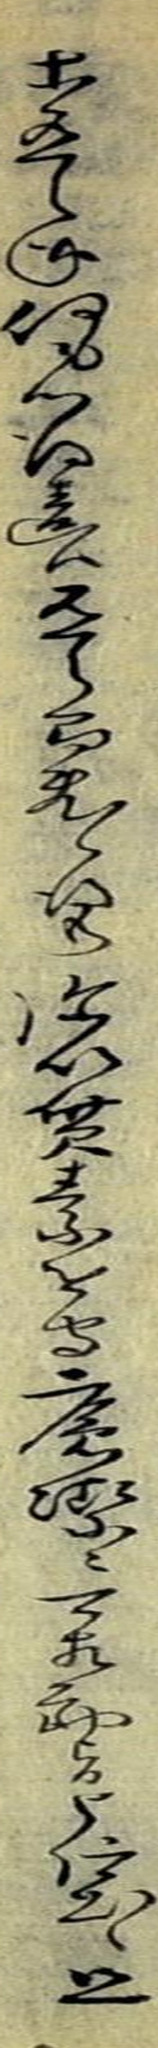等有之趣何も心得違ハ有之間敷候得共弥以質素を守廉潔ニ可相勤旨被仰出候且
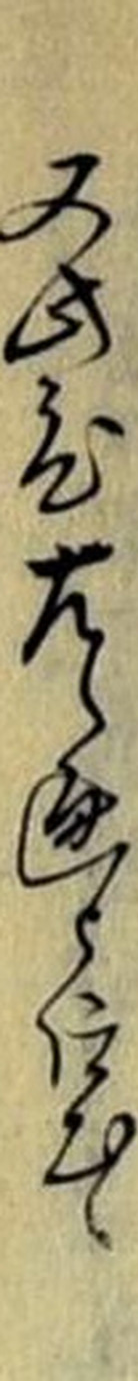又此度左之通被仰出候
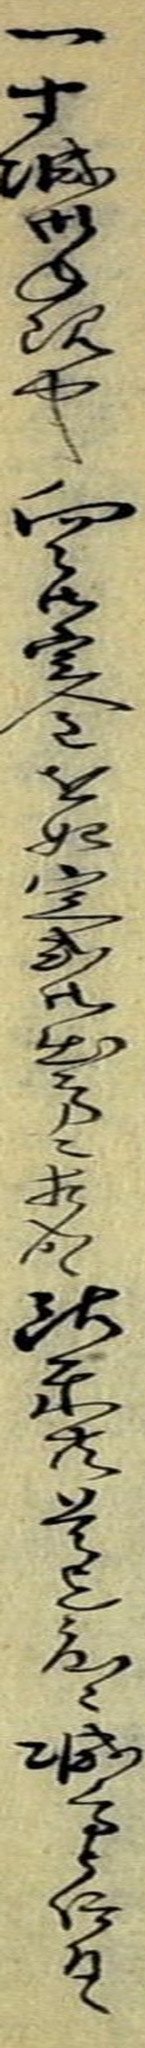一半減御年限中向々御定金を始定式御出方ニ相成候銀米共是迄度々減事被仰付候
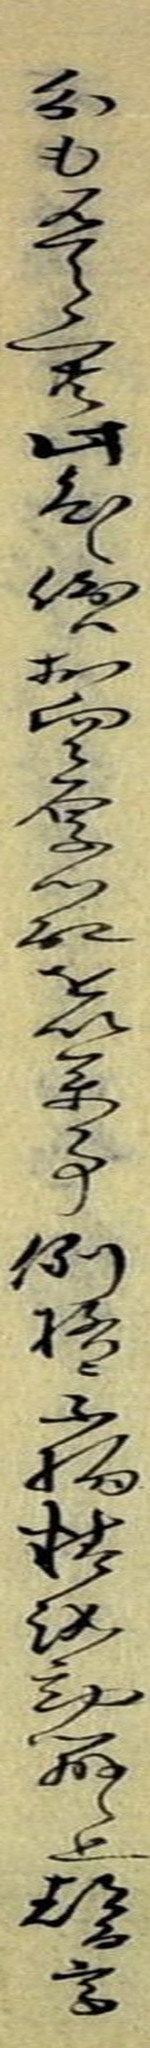分も有之候へ共此度之儀ハ於向々厚心配を以万事例格ニ不拘精誠勘弁之上都而高
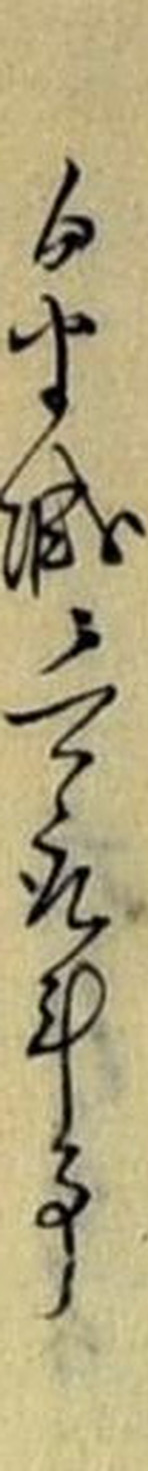ゟ半減ニ可取計事
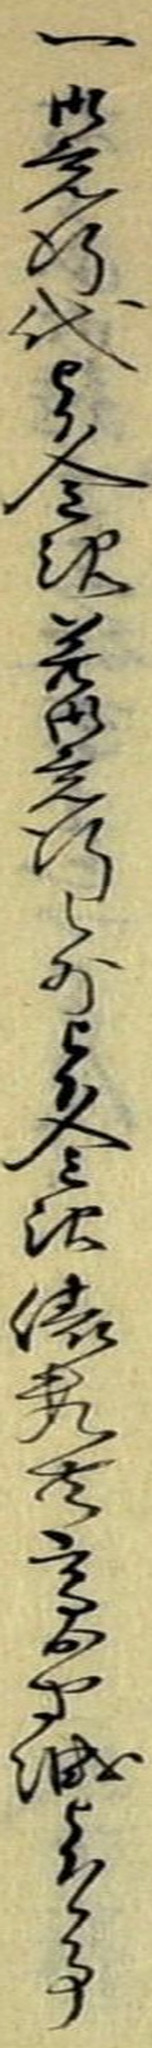一御充行代被下金銀并御充行之外被下金銀俵数共高ゟ半減被下候事
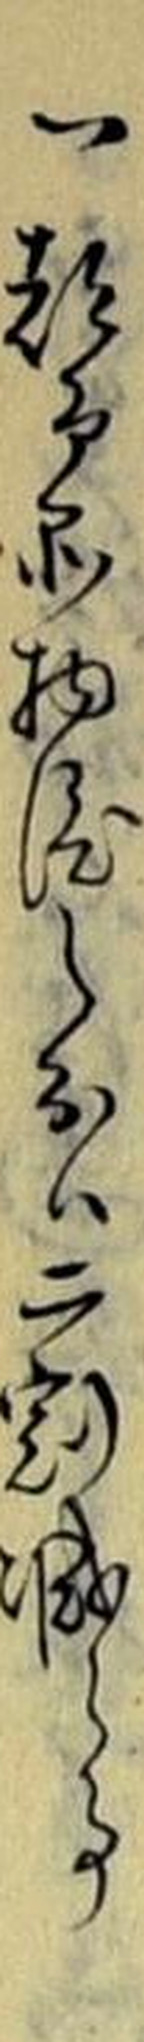一都而品物渡之分ハ二割減候事
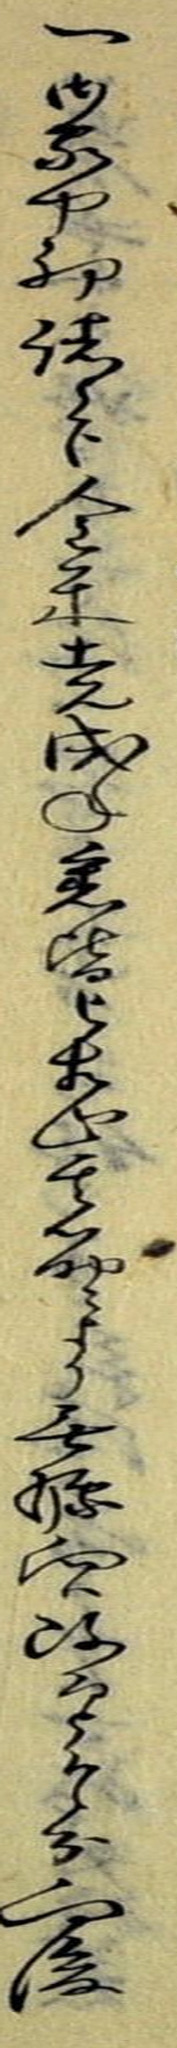一御家中初諸被下金米去ル戌年悉皆被相止其筋ニより無拠向ハ改而被下候分向後
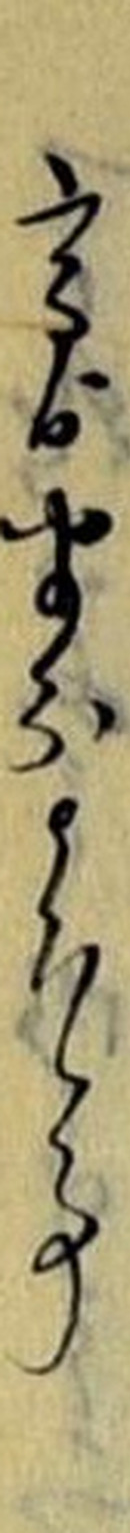高ゟ半分被下候事
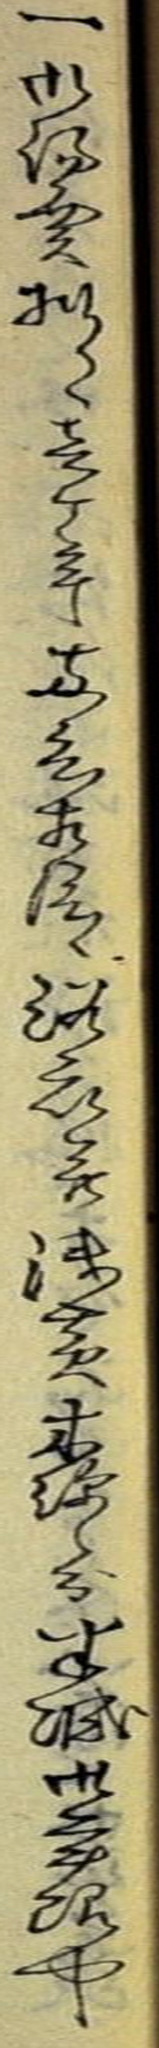一御備買掛りへ壱ケ年両度相渡候浴衣并浅黄木綿之分半減御年限中
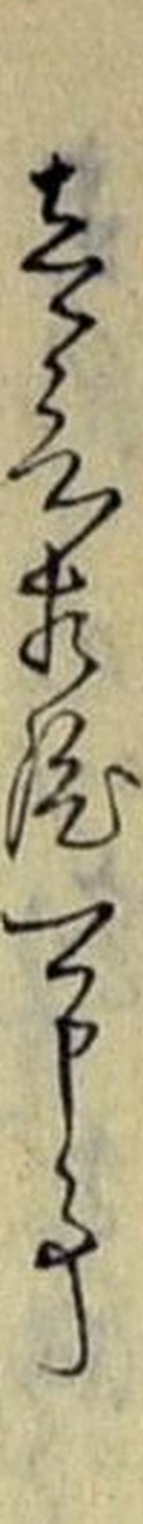壱度相渡可申事
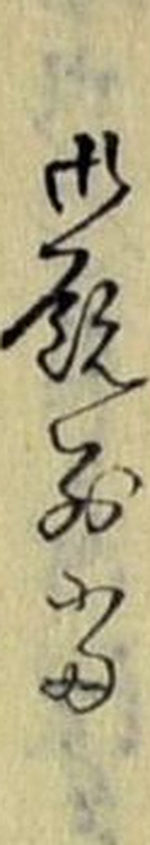御厩別当
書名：命令之部 五
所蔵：福井県文書館 Fukui Prefectural Archives
